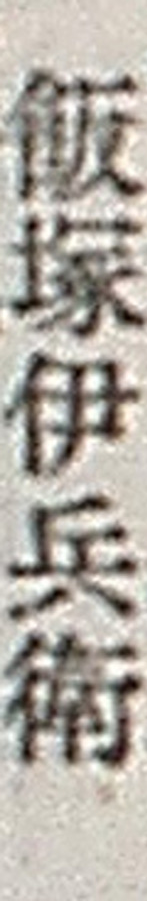飯塚伊兵衛
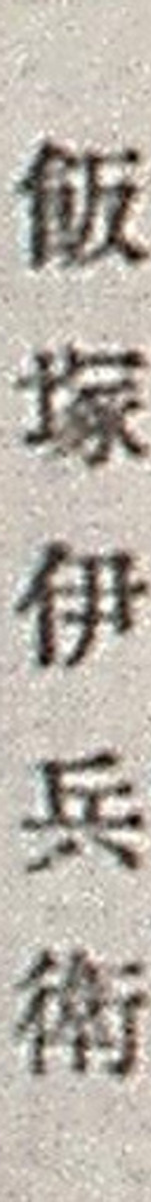飯塚伊兵衛
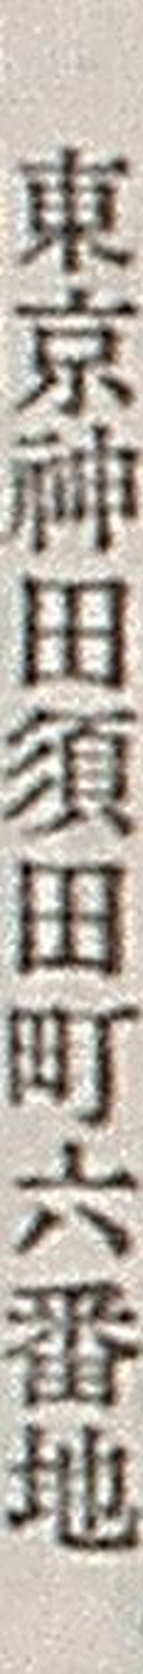東京神田須田町六番地
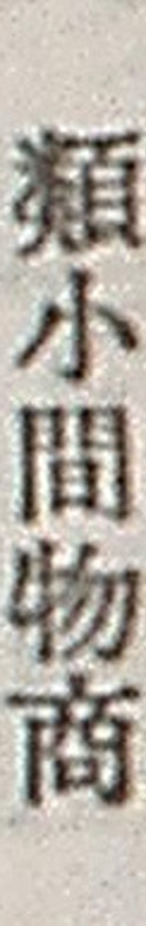類小間物商
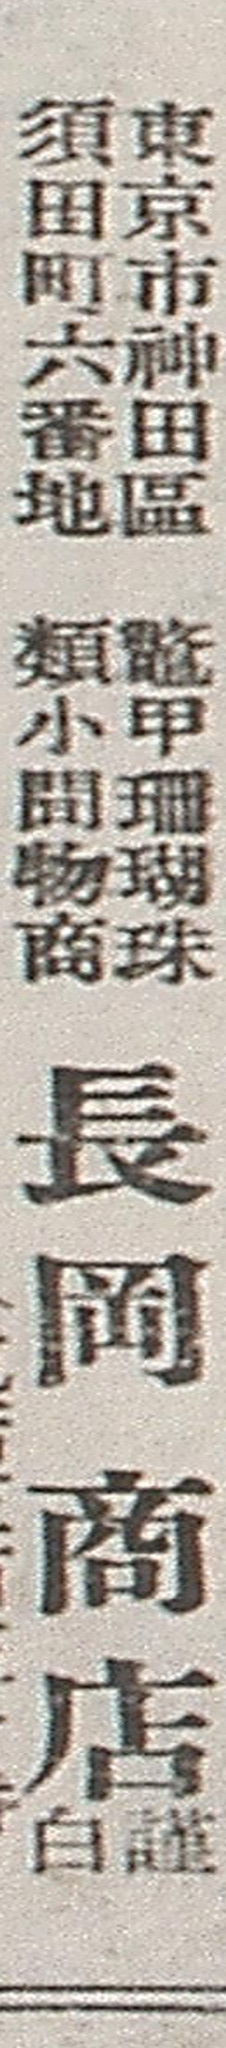須田町六番地類小間物商白
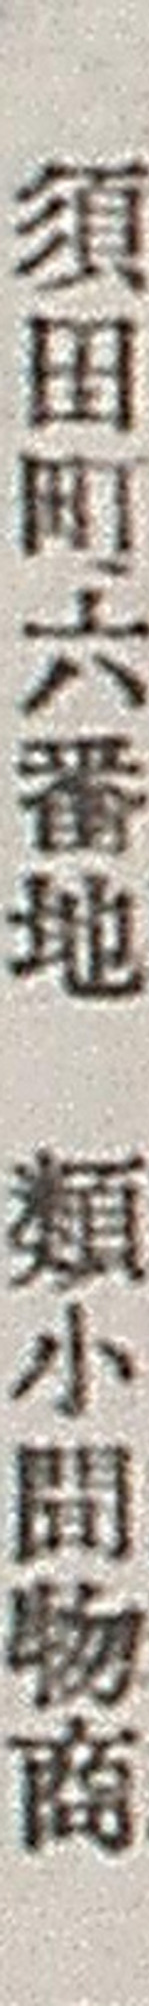須田町六番地類小間物商白

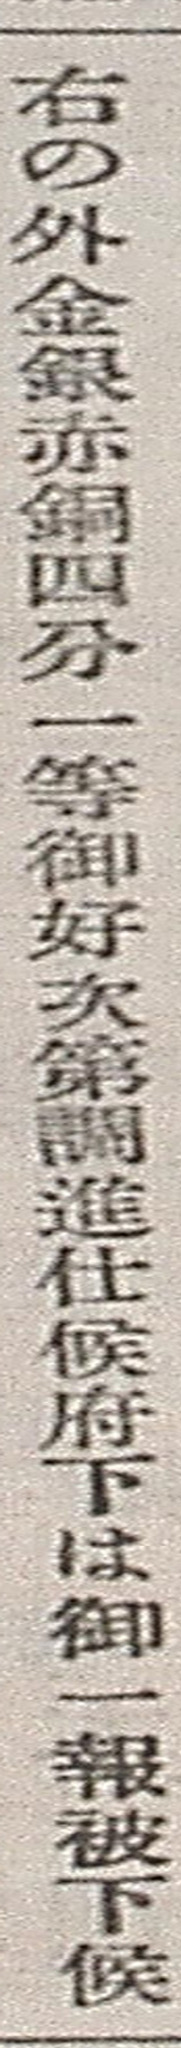右の外金銀赤銅四分一等御好次第調進仕候府下は御一報被下候
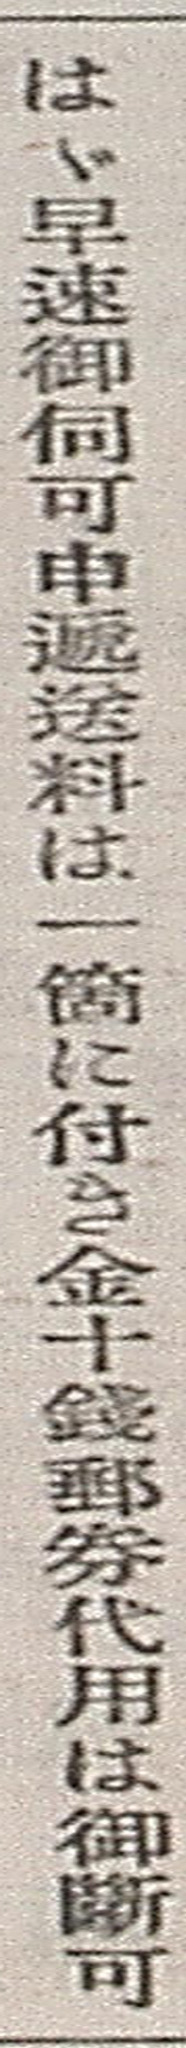はゞ早速御伺可申逓送料は一箇に付き金十銭郵券代用は御断可
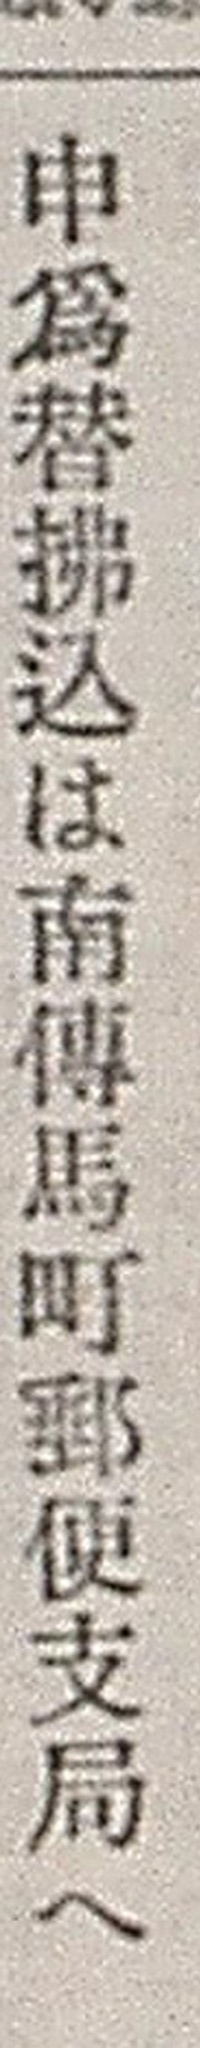申為替拂込は南伝馬町郵便支局へ
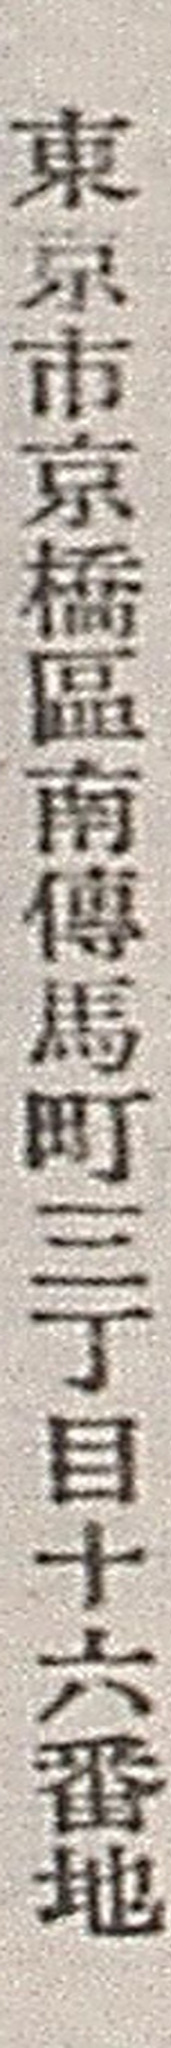東京市京橋区南伝馬町三丁目十六番地

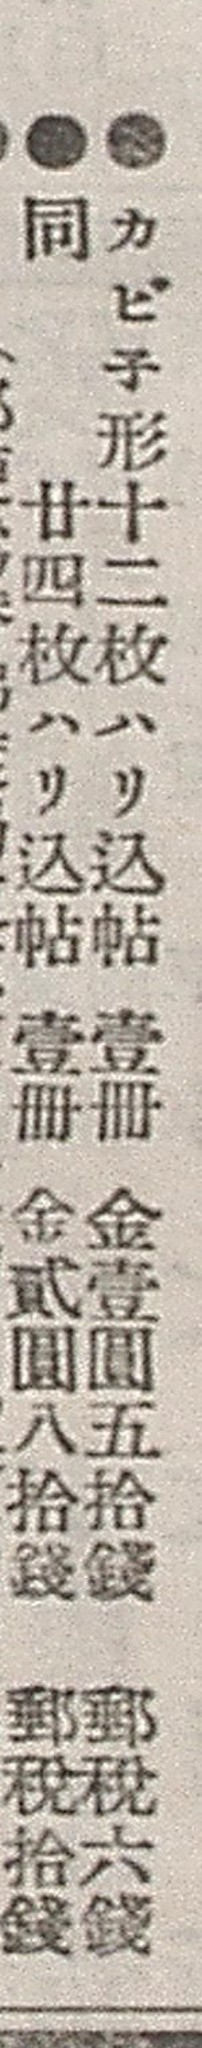●カビ子形十二枚ハリ込帖一冊金一円五十銭郵税六銭
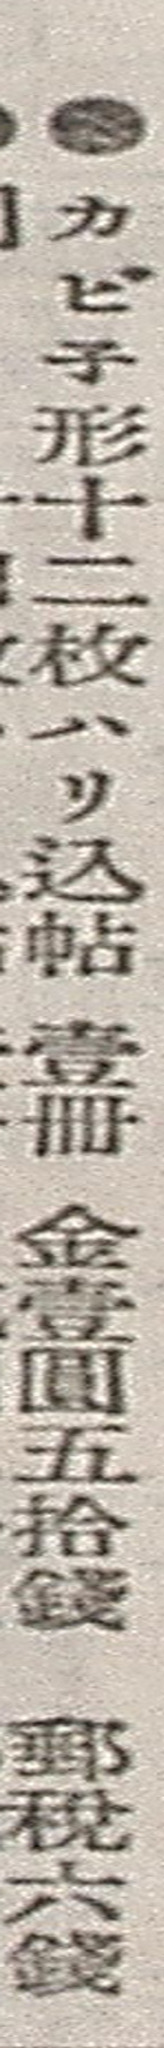●カビ子形十二枚ハリ込帖一冊金一円五十銭郵税六銭
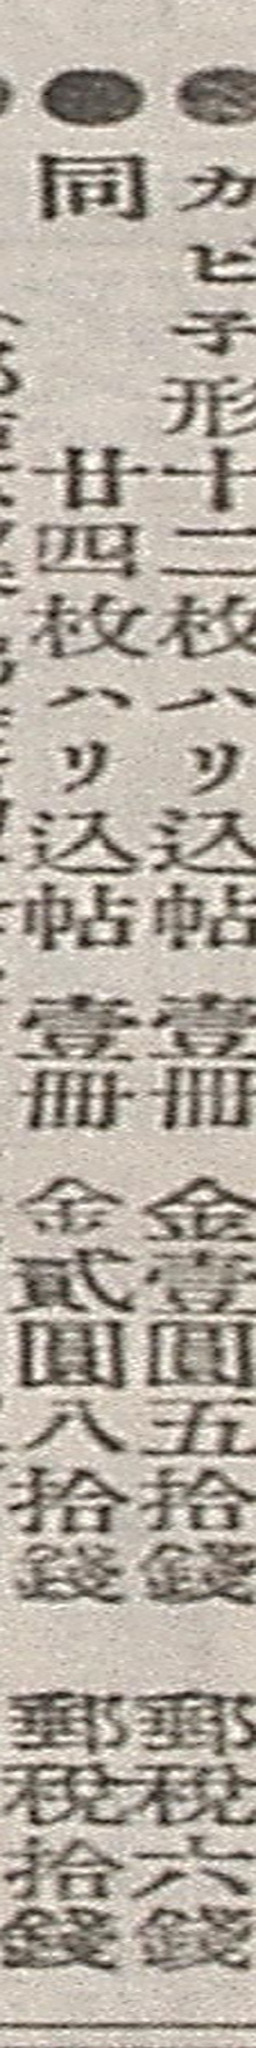●同廿四枚ハリ込帖一冊金二円八十銭郵税拾銭
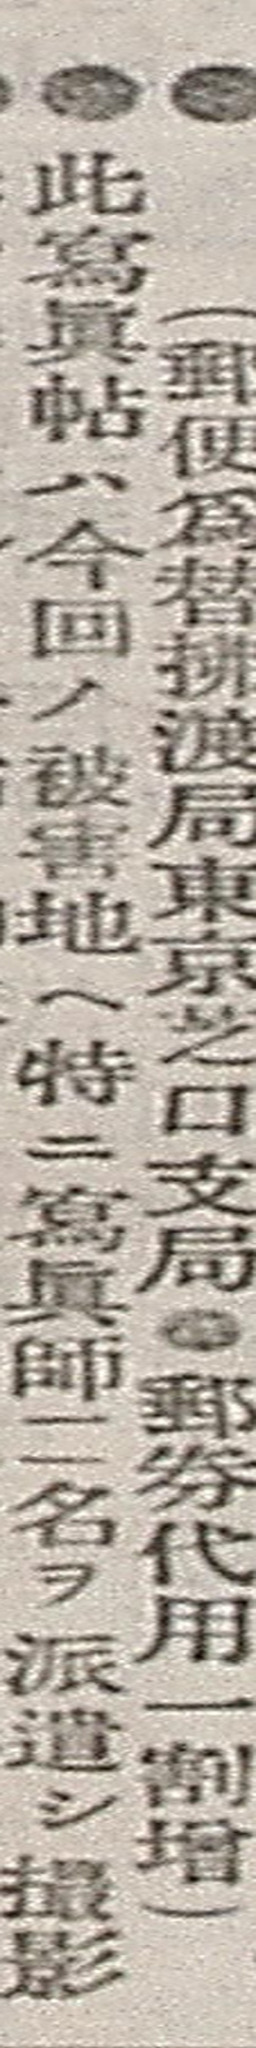●此写真帖ハ今回ノ被害地へ特二写真師二名ヲ派遣シ撮影
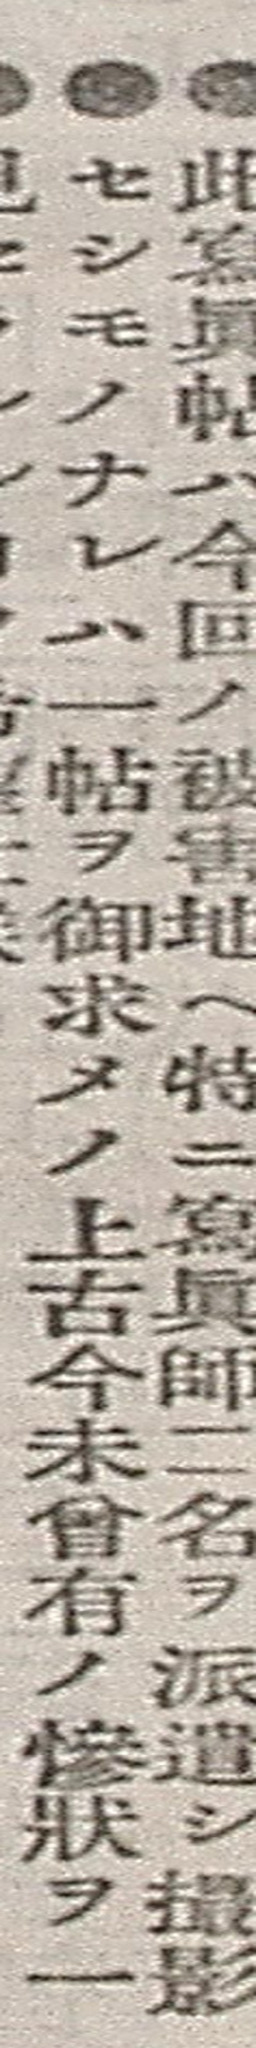●セシモノナレハ一帖ヲ御求メノ上古今未曾有ノ惨状ヲ一
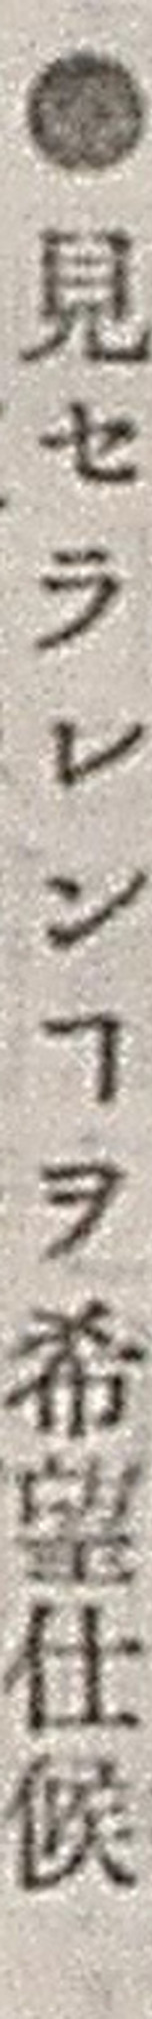●見セラレンヿヲ希望仕候
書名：風俗畫報臨時増刊第百十九號　大海嘯被害録（中）
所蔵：東京大学地震研究所図書室 Earthquake Research Institute Library, The University of Tokyo, JAPAN
